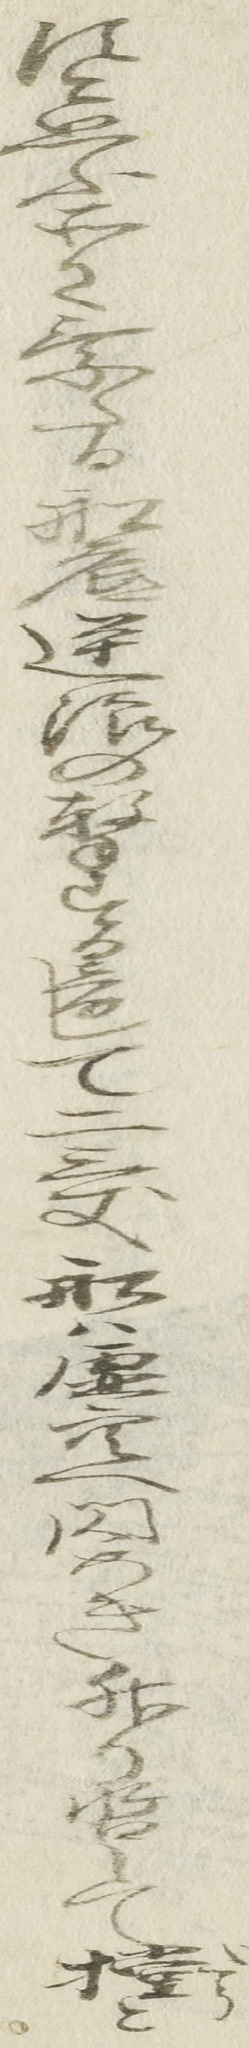すと思ふ所に乗たる船底逆流の撃する音してニ三丈船ハ虚空へ閃き居り暫して摚と
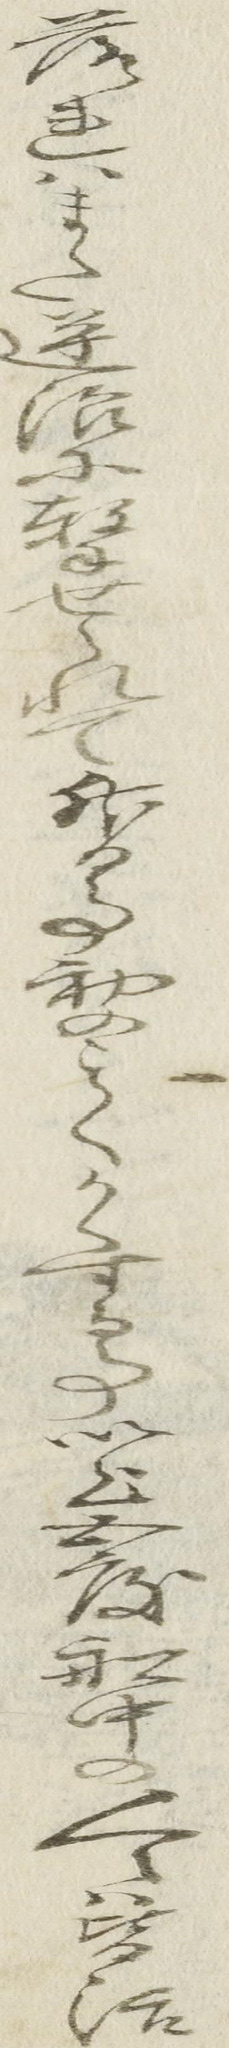落れハまた逆流に撃せられて居る事初のことくかくする事以上五度船中の人〻ハ皆活
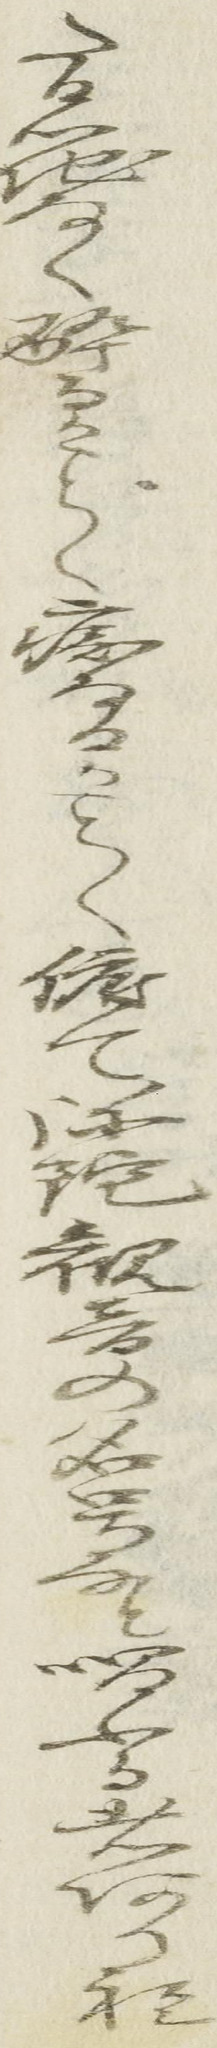たる心地なく酔るかことく痴なるかことく俯て弥陀観音の名号なと唱ふる者あり程
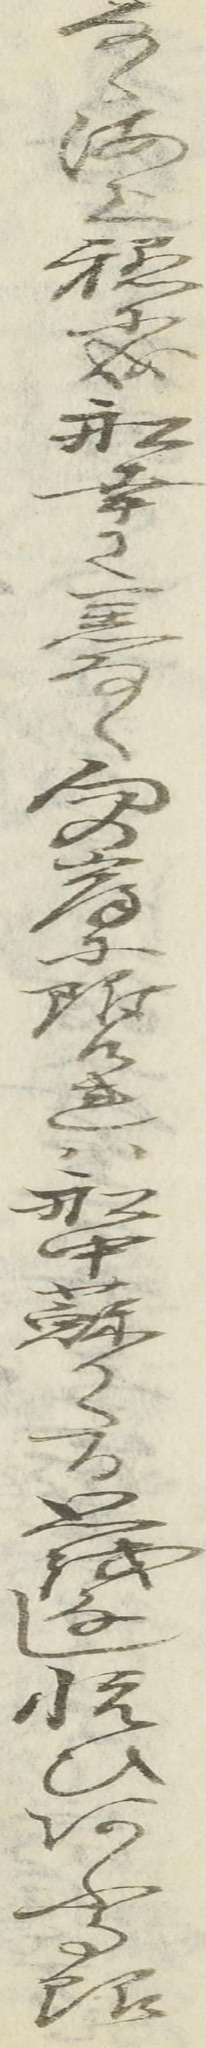なく海上穏に成船幸に恙なく向の岸に附ケれハ船中蘇りたる思をなし悦ひあふる限
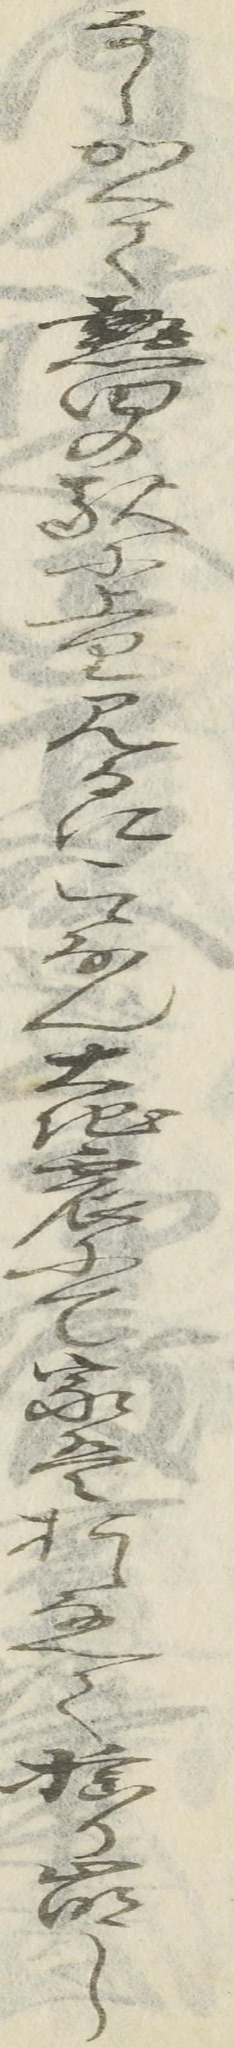なしかくて熱田の駅に上り見るにこゝなん大地震にて家は柱なへて揺り崩し
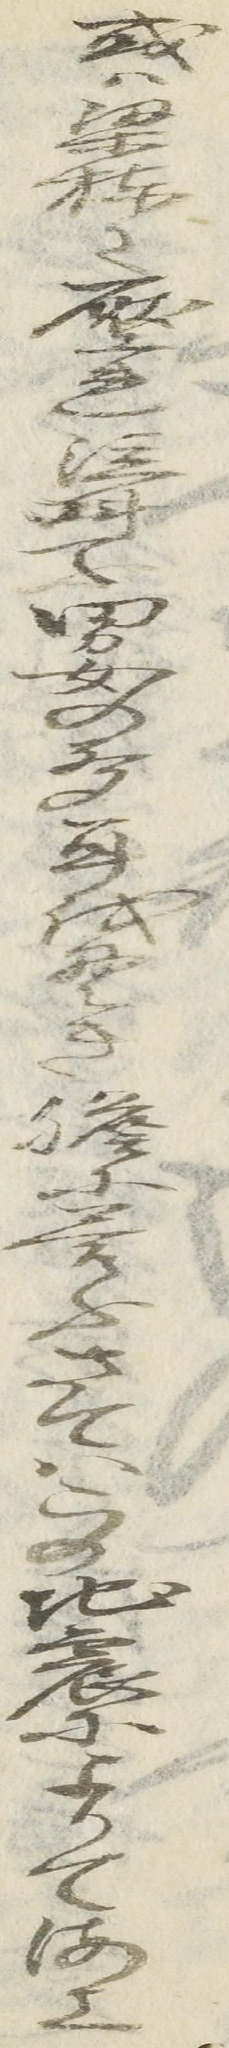或ハ梁棟に圧れ泣叫て男女の聲耳を貫き膽に答ふさてハこの地震によりて海上
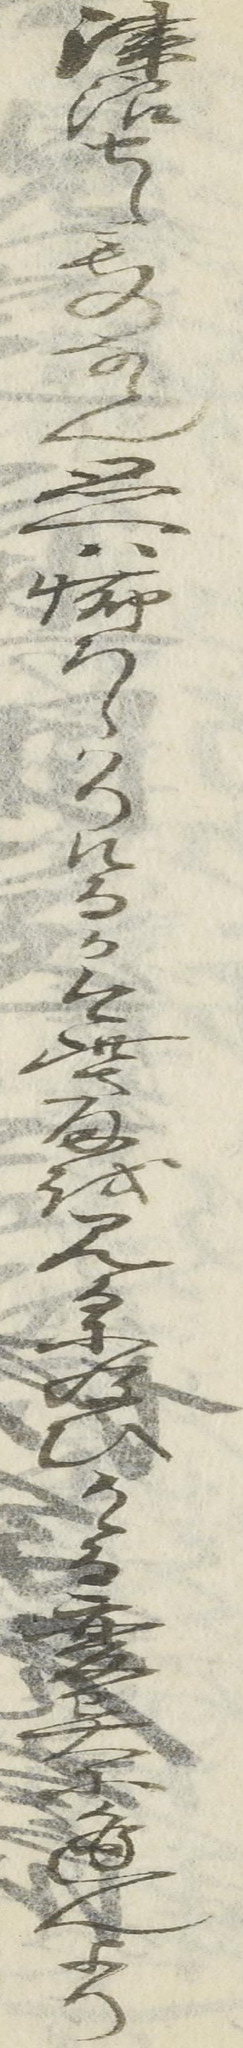津浪セしものならん思へハ怖ろしかりケるに今此さまを見るに及ひかゝる変異に逢んより
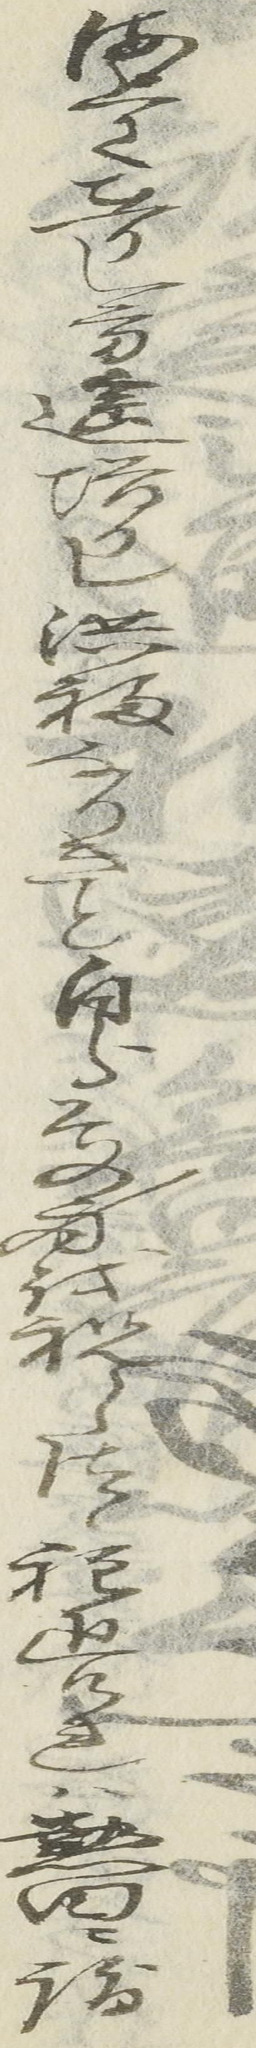海上に在りし方遥増りし洪福なりきと自分其身を祝しつゝ程近ケれハ熱田ニ詣
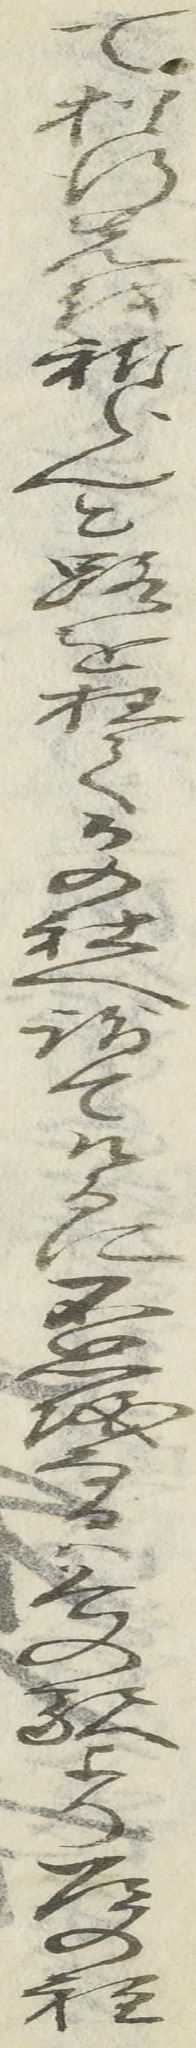て猶行先を祈らんと路を枉てかの社へ詣てケるに不思議なるハその駅より道の程
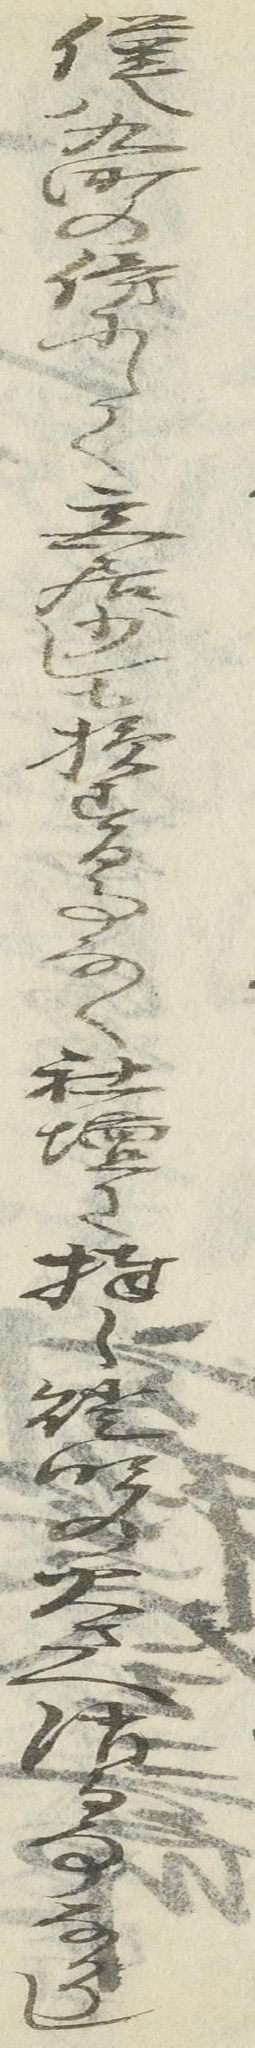僅八九町の傍にして宮居少しも損する事なく社壇に捧し燈明の火さへ消る事なかりし
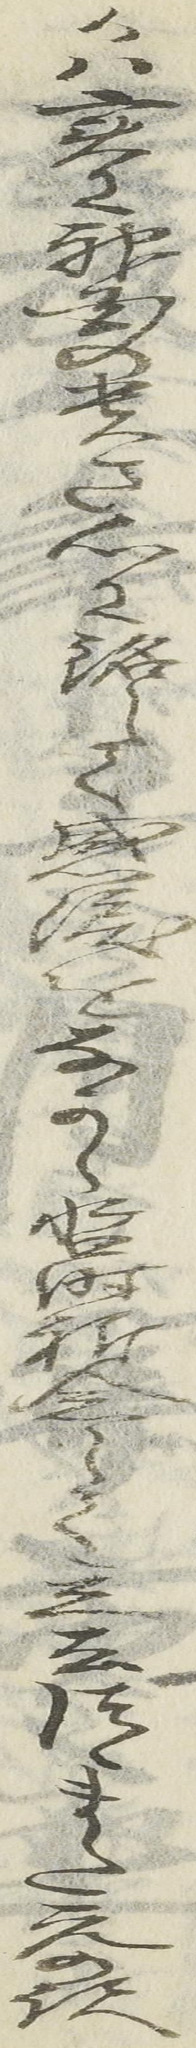かハ実に神国の貴さ心に銘して感涙をなかし暫時祈念して立去つゝまた元の訳
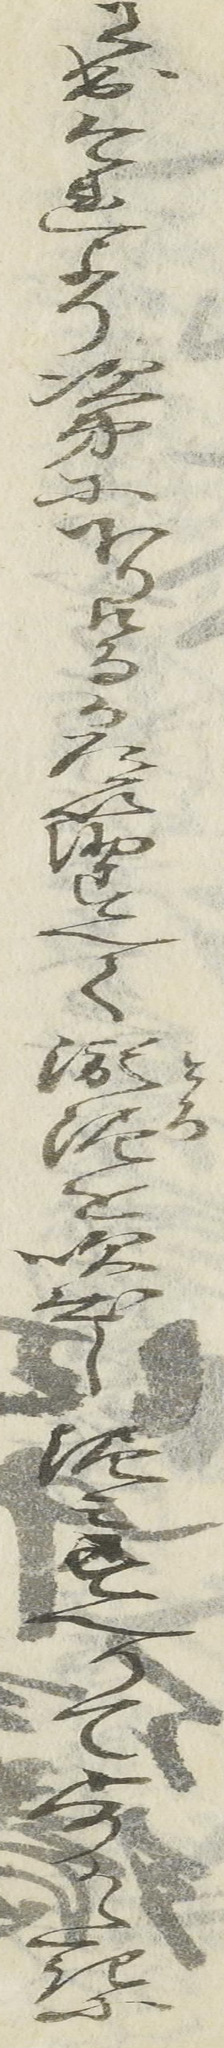に出それより次第に下りたるか道筋すへて淤泥を吹出し泥之すへりて歩かたきに
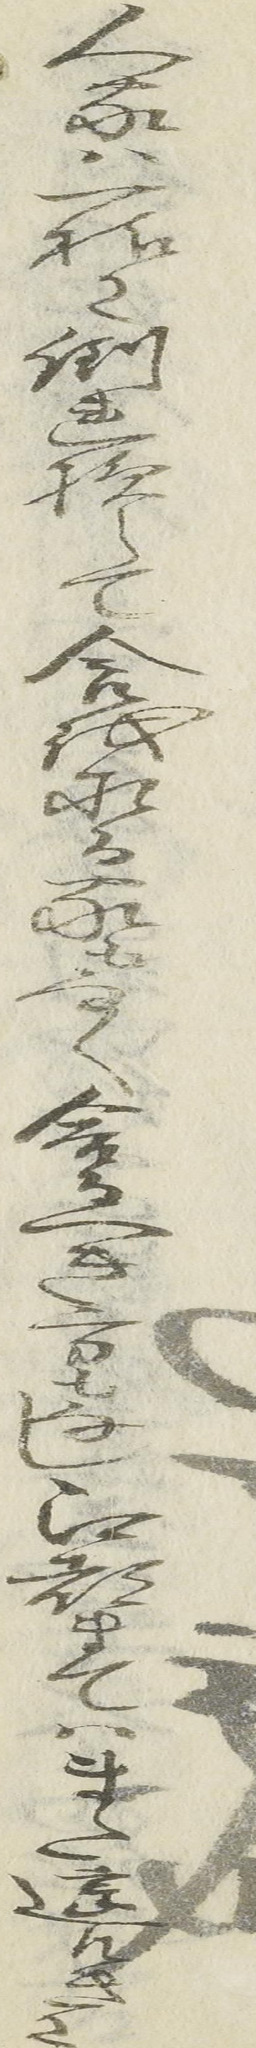人家ハ一様に倒れ損して食を求る家もなく食るへき方もなし江都まてハまた遠ケきに
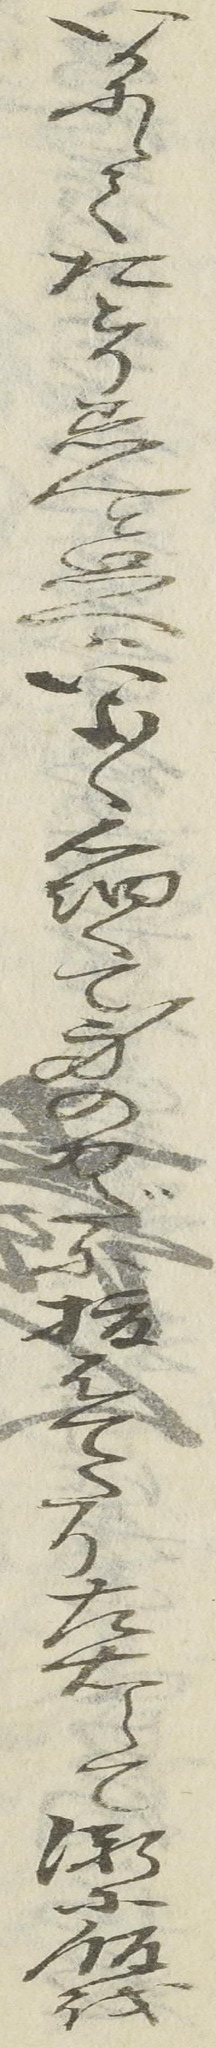いかにしてたとり着んと思へハいよ〳〵心細くて身の力だに抜はてたり左右して漸に飯を
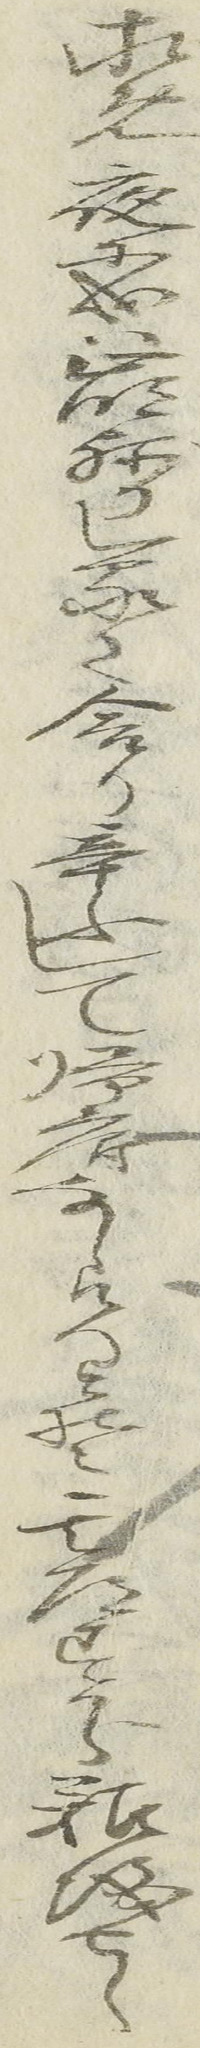求め夜に成ハ崩残りし家に舎り辛ふして帰府なしケりとそ其道すから難儀セし

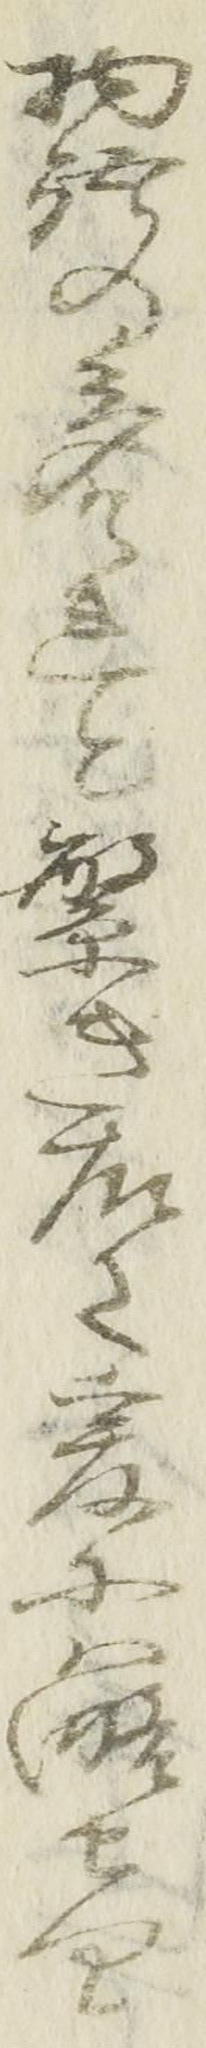物語の多ケれと繁き故に爰にハ略セり
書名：安政乙卯江戸大地震筆記　安政丙辰八月大阪大雷雨之記追加　安政三辰年七月松前辺大地震并八月大風雨記録
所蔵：東京大学地震研究所図書室 Earthquake Research Institute Library, The University of Tokyo, JAPAN
